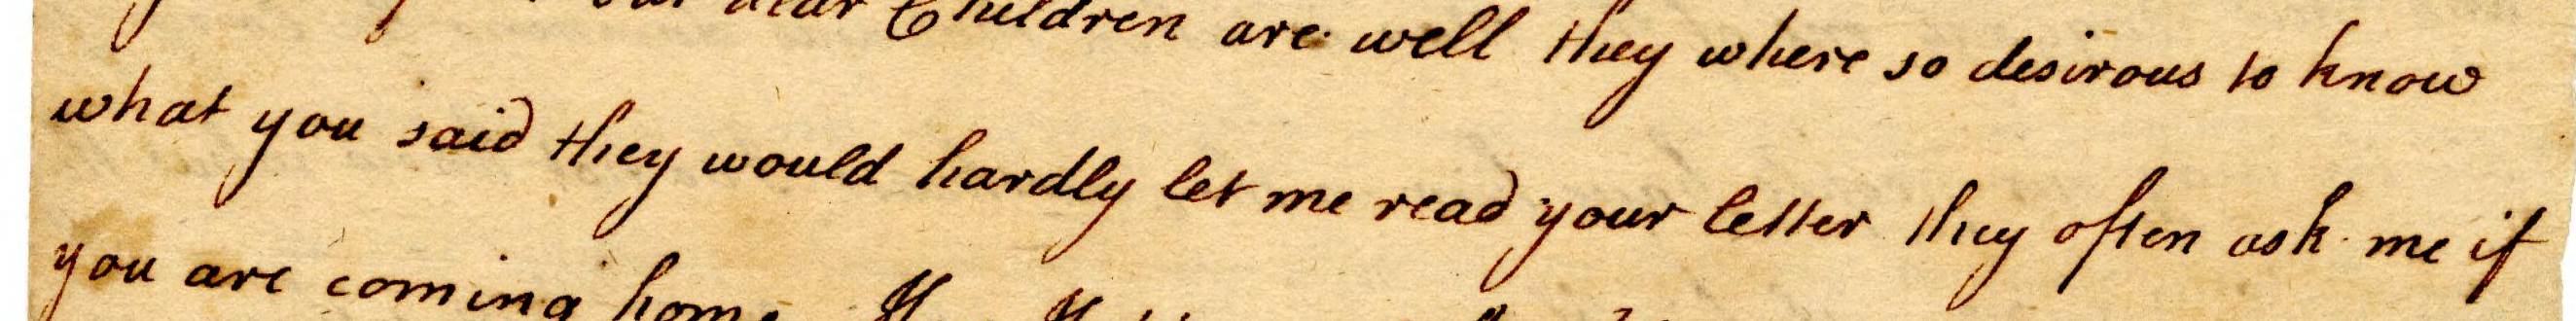what you said they would hardly let me read your letter they often ask me if
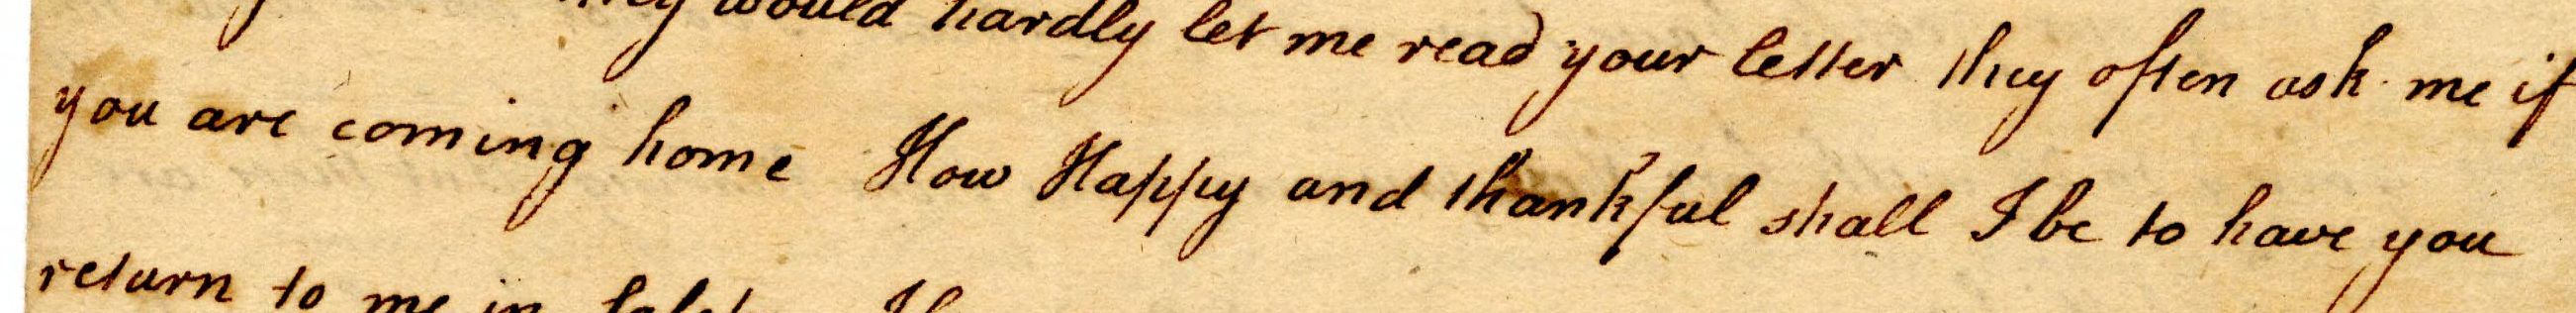you are coming home How Happy and thankful shall I be to have you
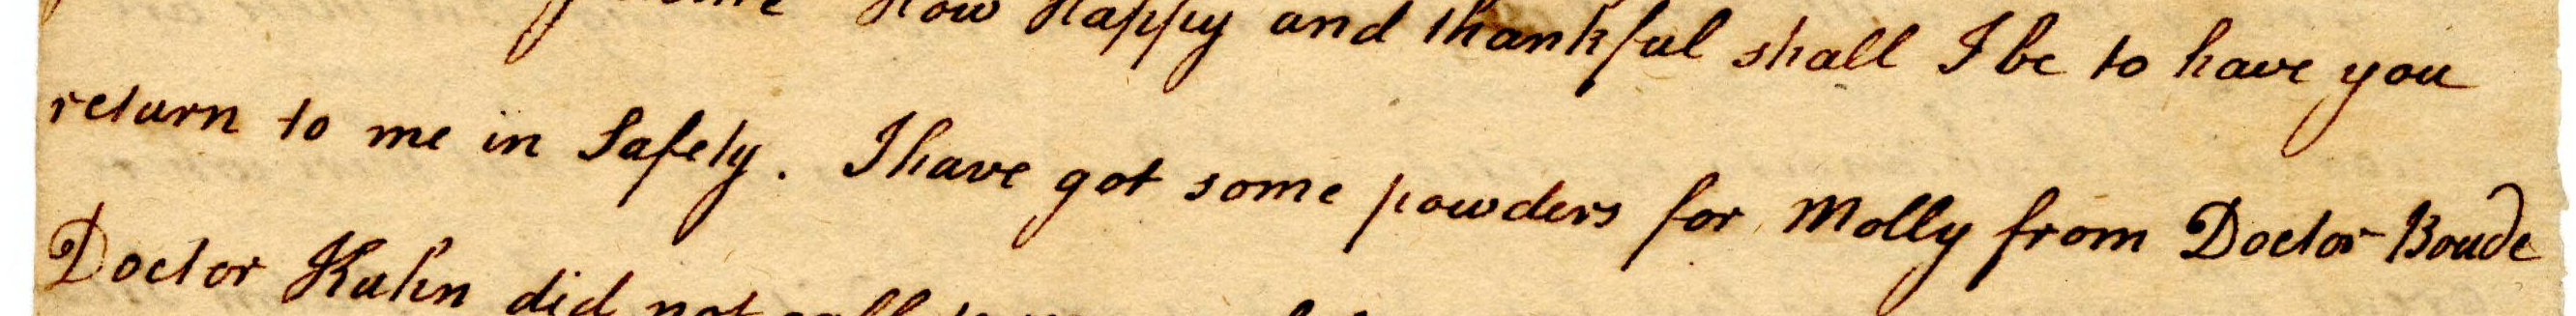return to me in Safety. I have got some powders for Molly from Doctor Boude
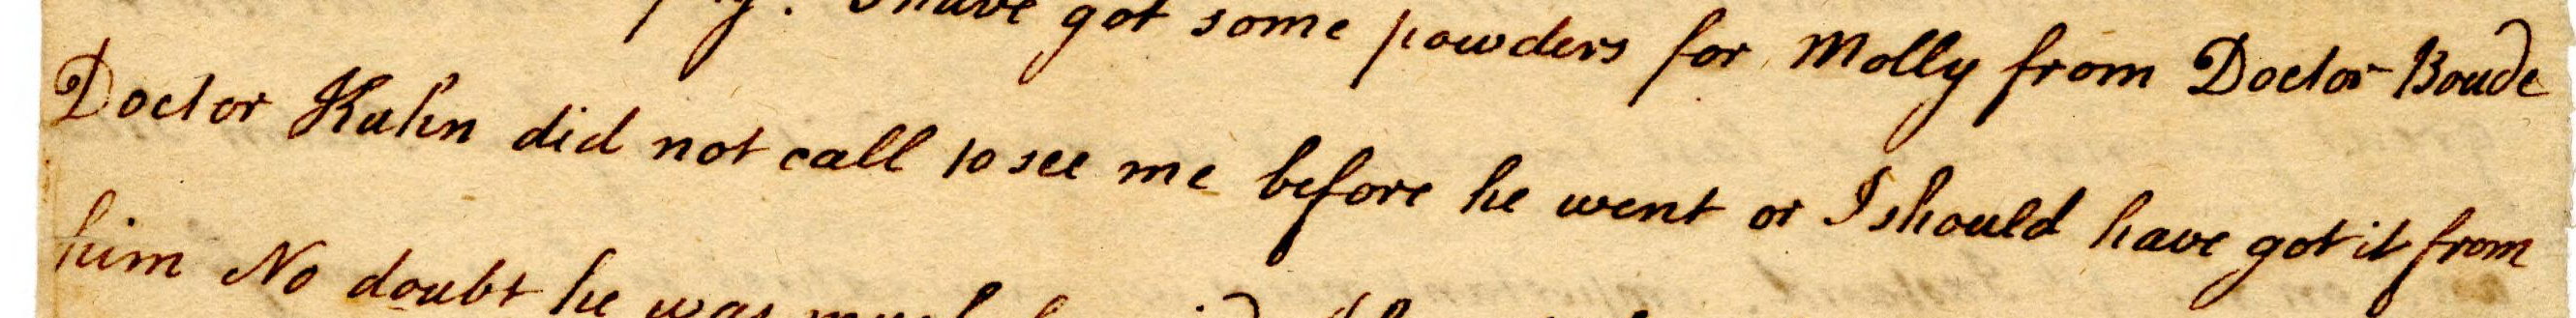Doctor Kahn did not call to see me before he went or I should have got it from
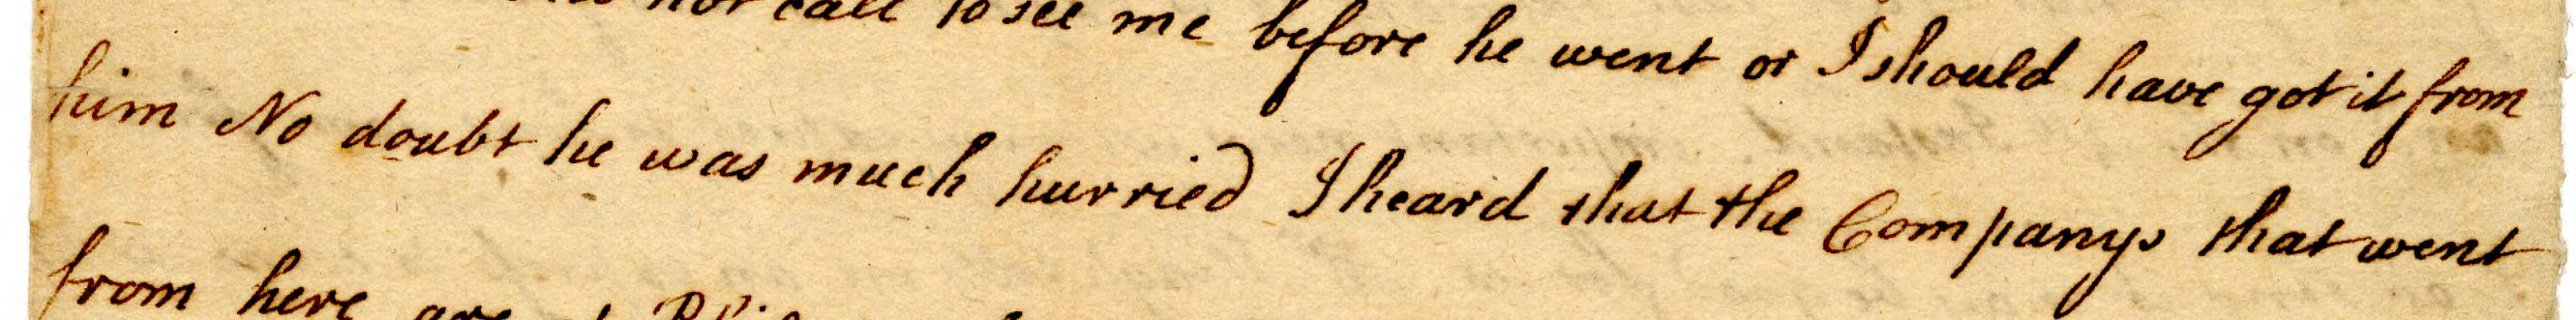him No doubt he was much hurried I heard that the Companys that went
